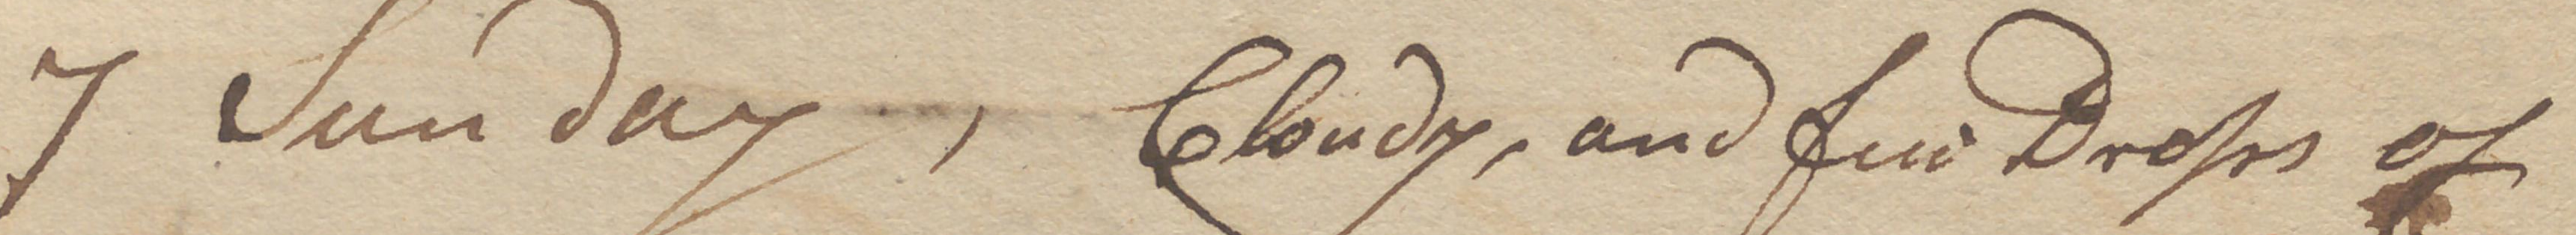7 Sunday, Cloudy, and few Drops of
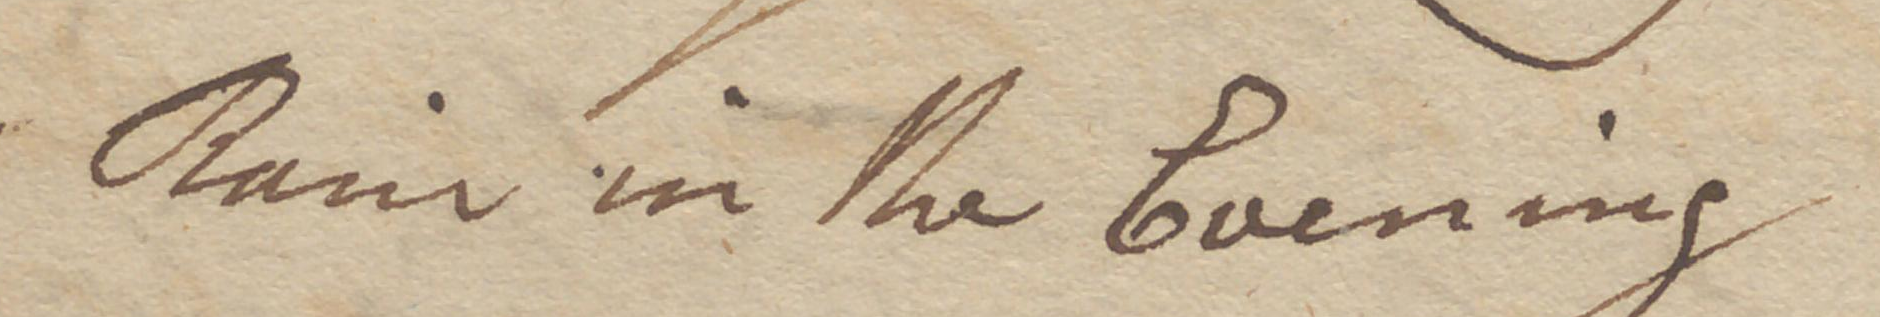Rain in the Evening
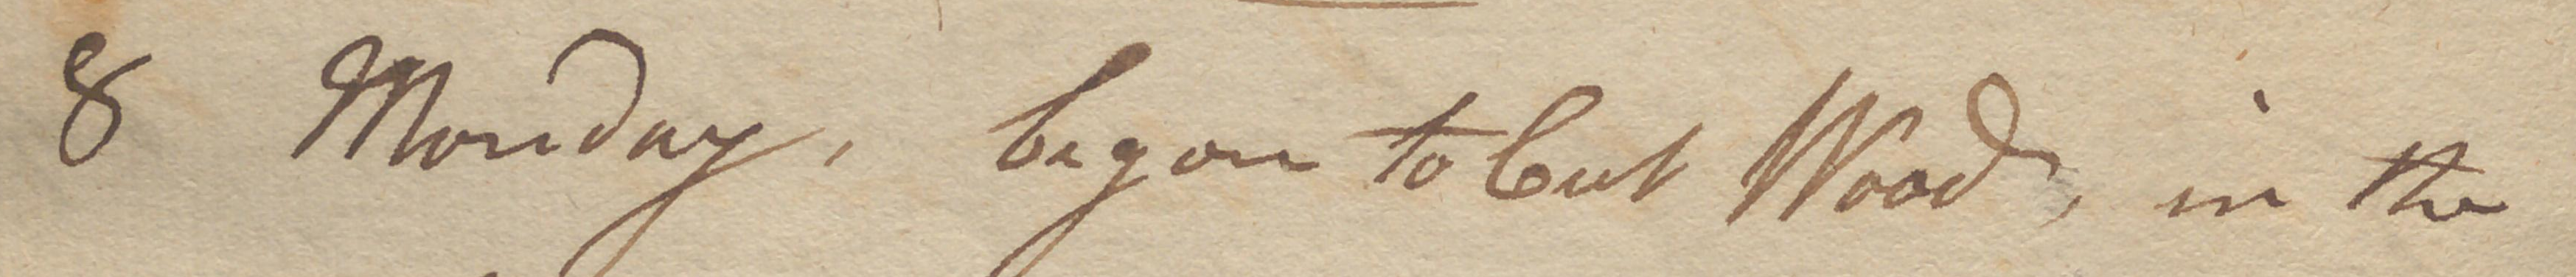8 Monday, begon to Cut Wood, in the
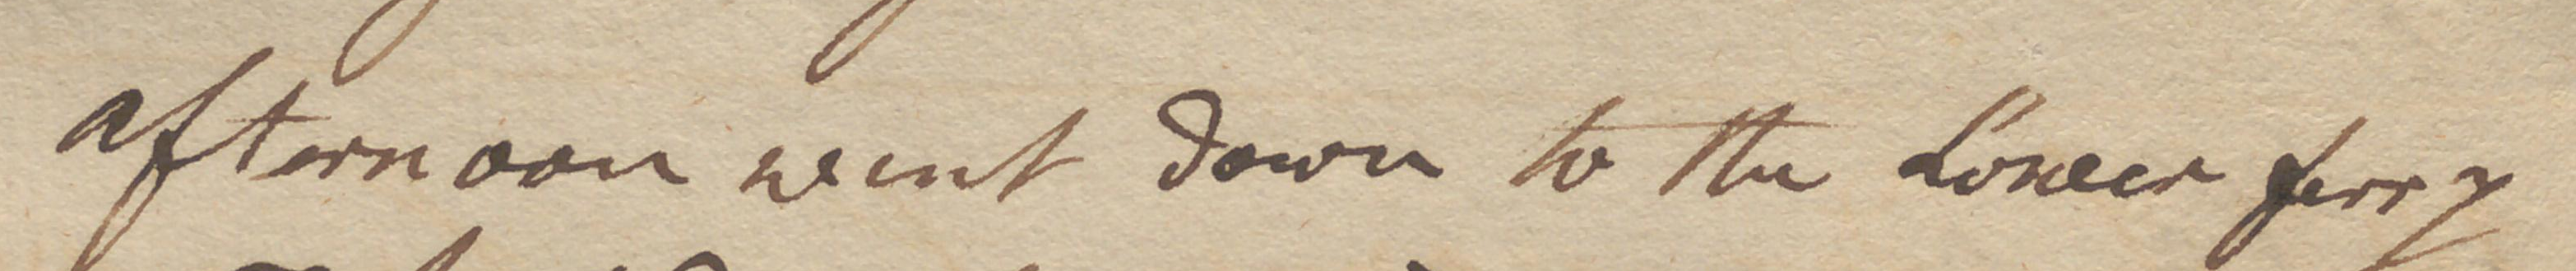afternoon went down to the Lower ferry
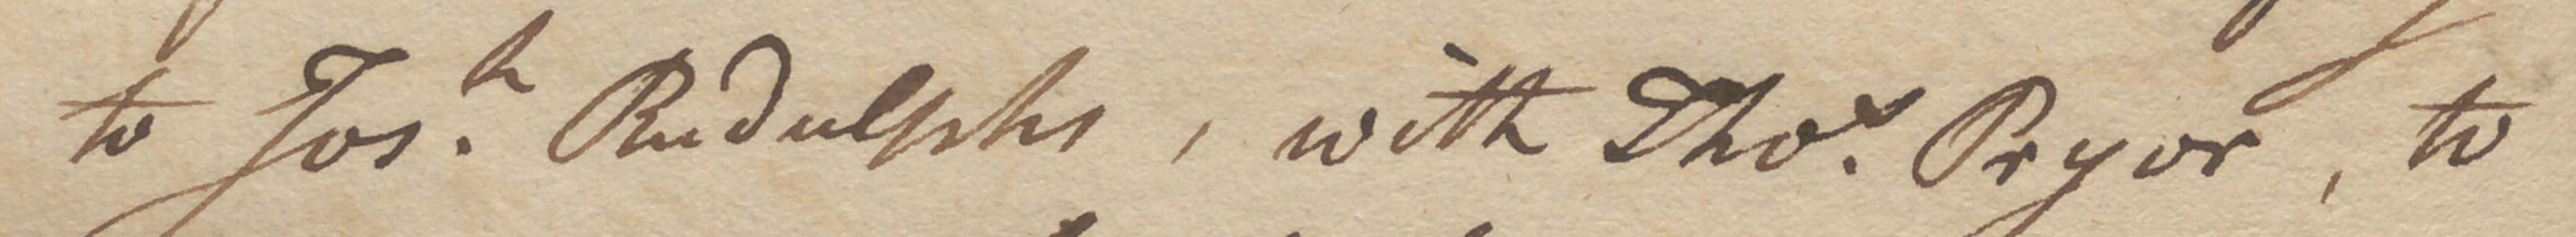to Jos^h. Rudulphs, with Tho^s. Pryor to
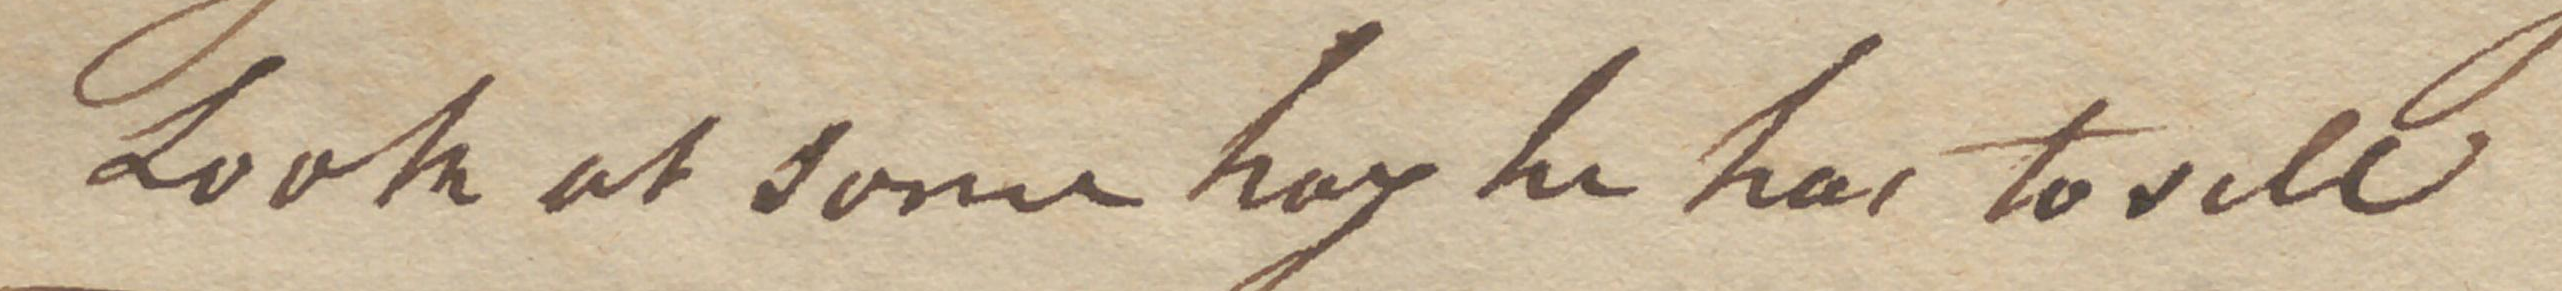Look at some hay he has to sell
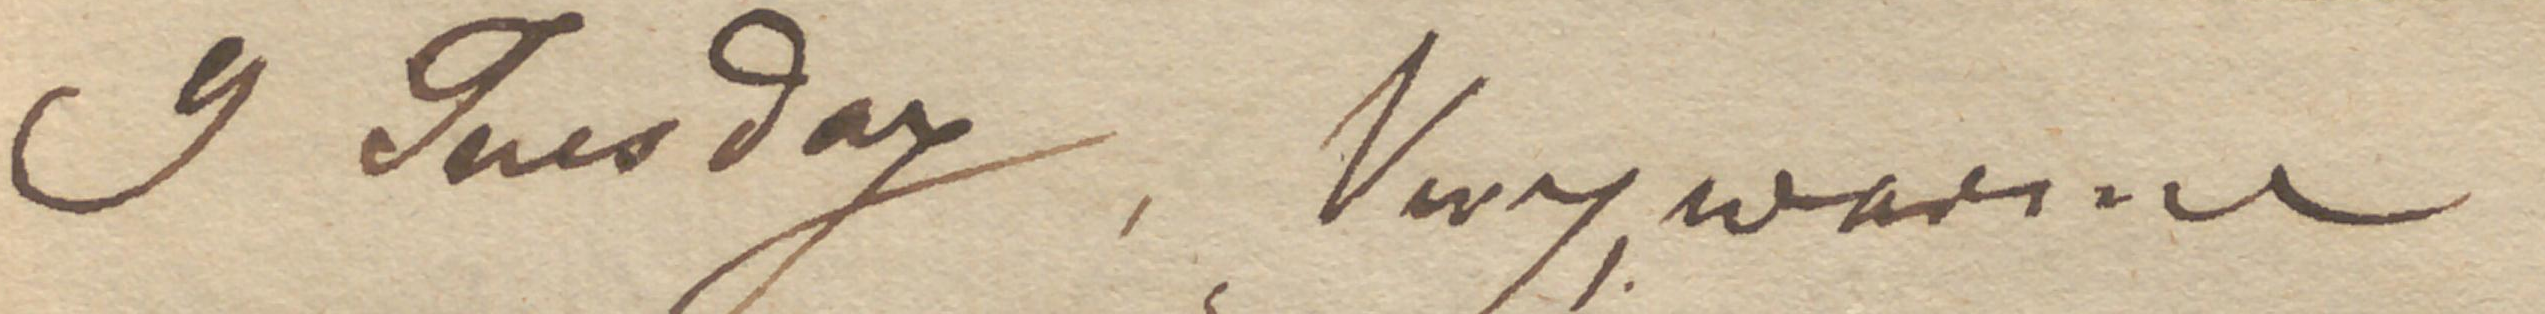9 Tuesday, Very warme
